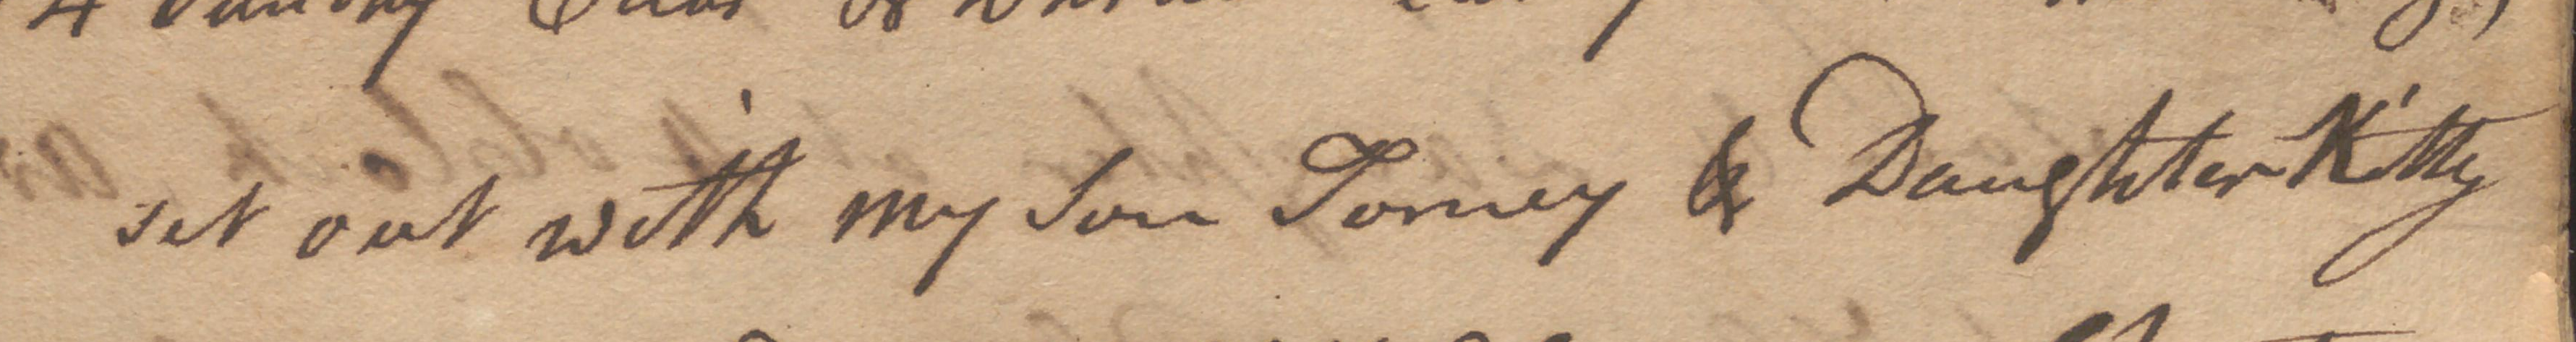set out with my Son Tomey & Daughter Kitty
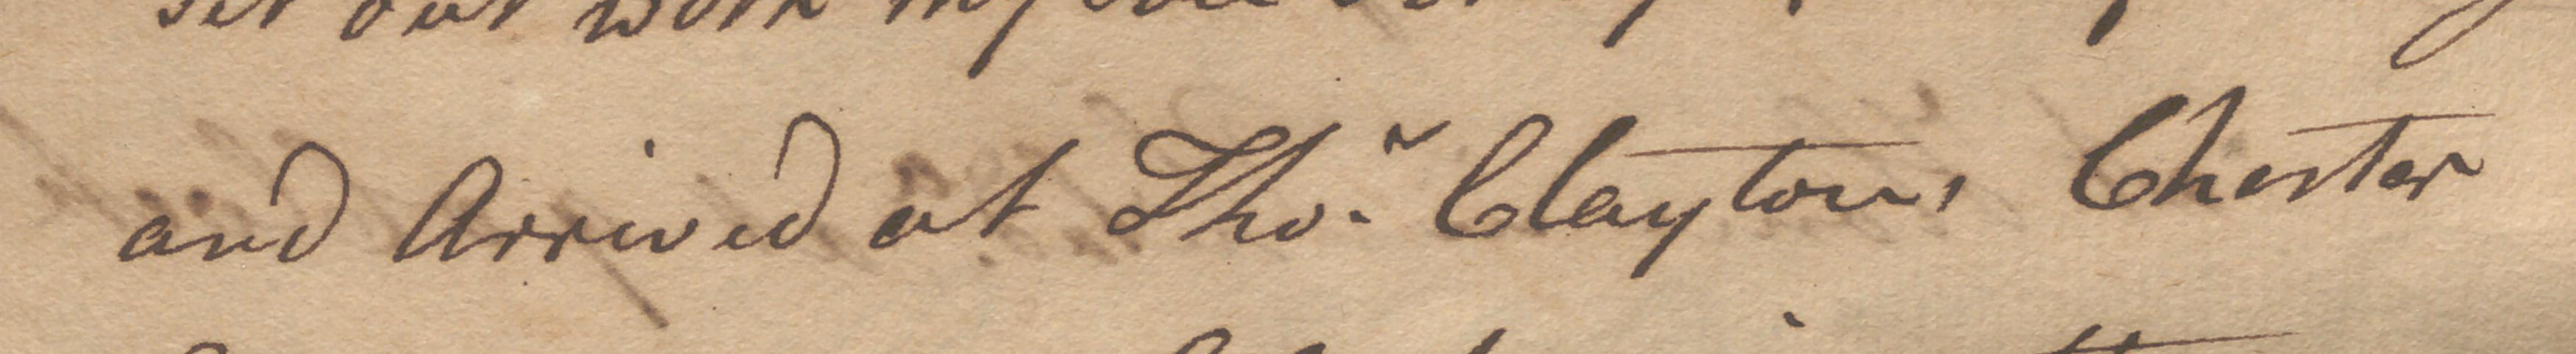and Arrived at Tho^s. Clayton, Chester
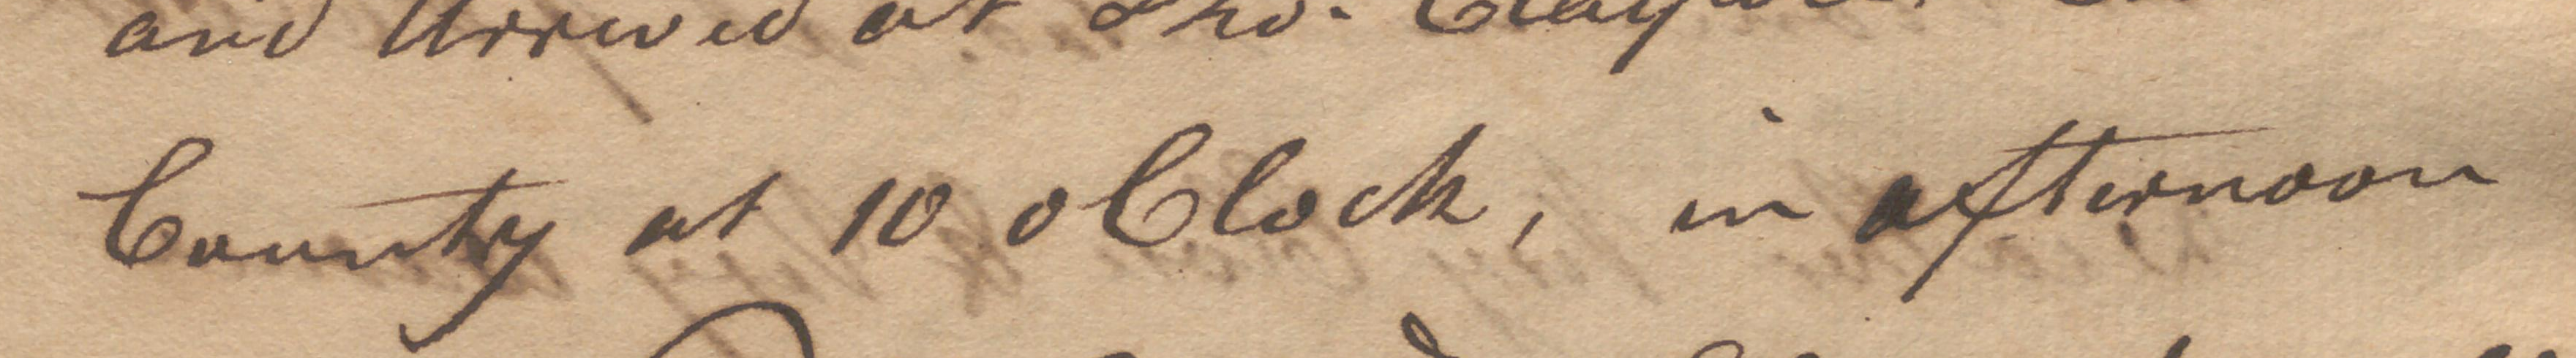County at 10 oClock, in afternoon
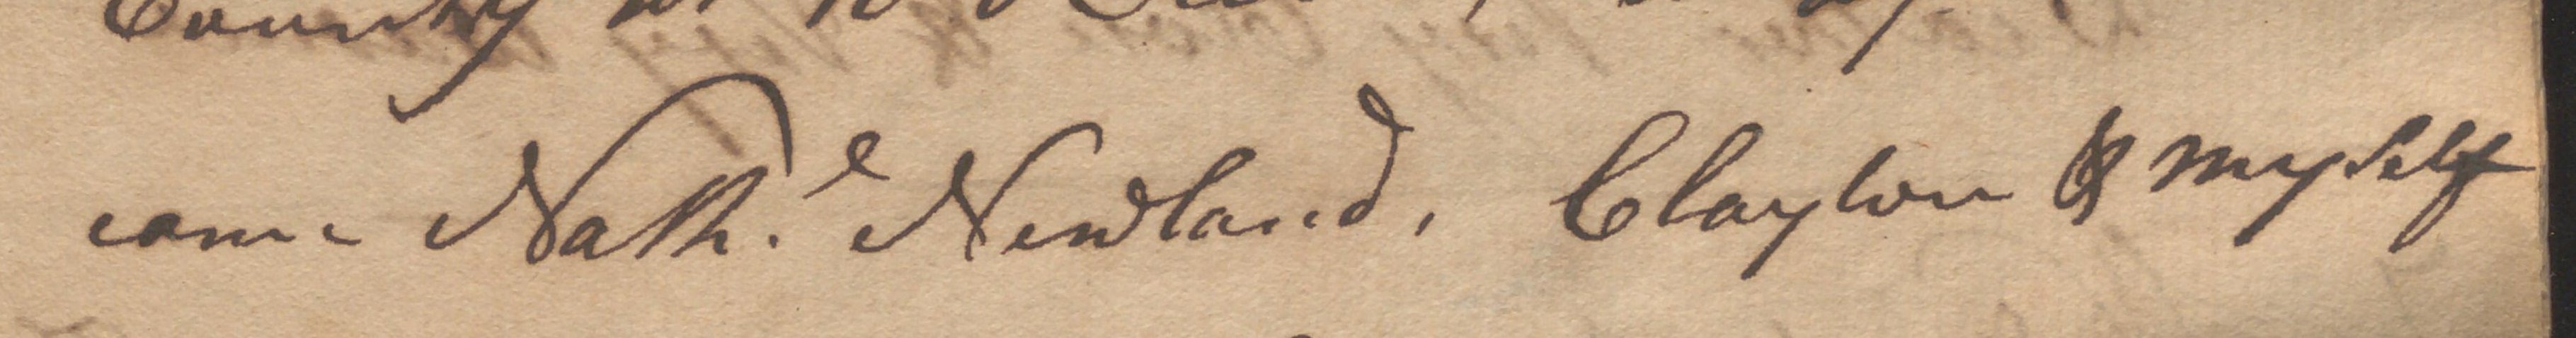came Nath^l. Newland. Clayton & myself
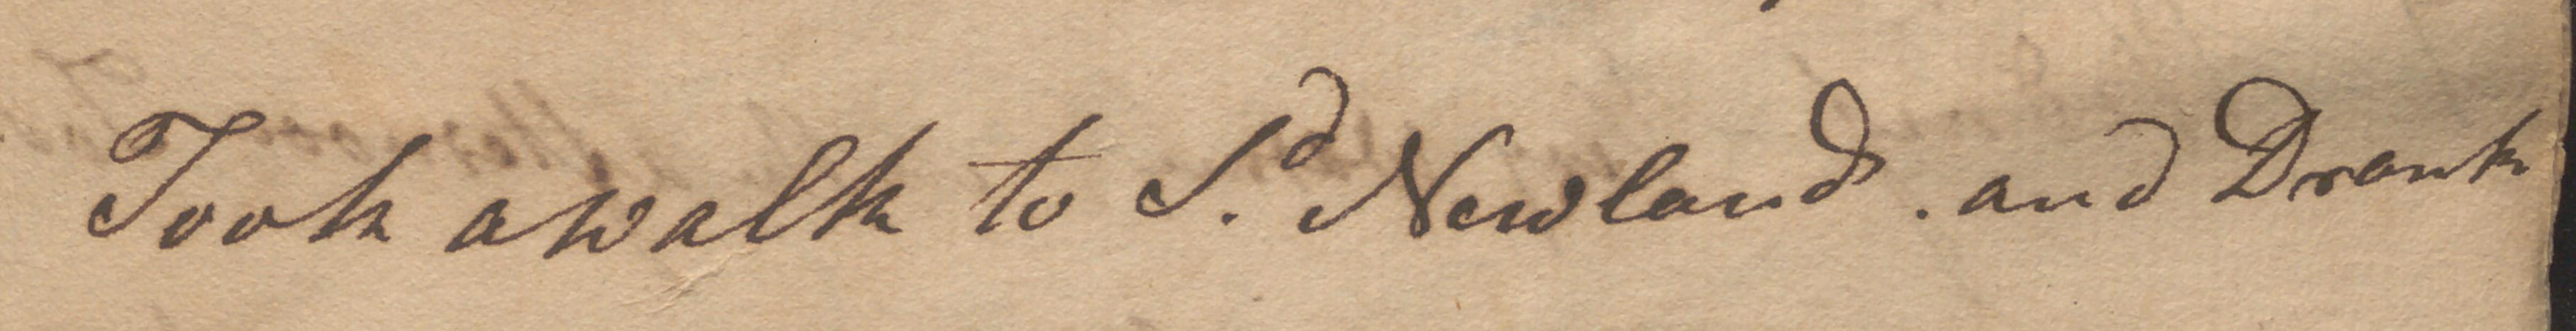Took a walk to S^d. Newland and Drank
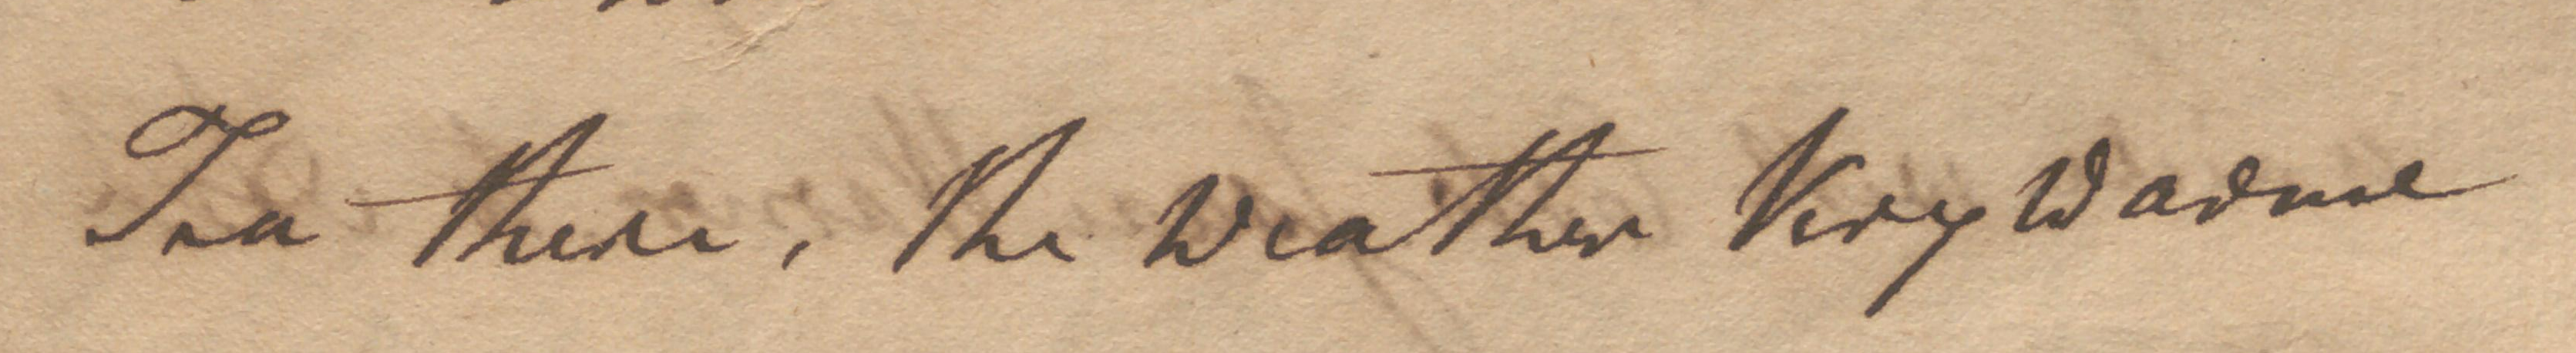Tea there, the weather Very Warme
